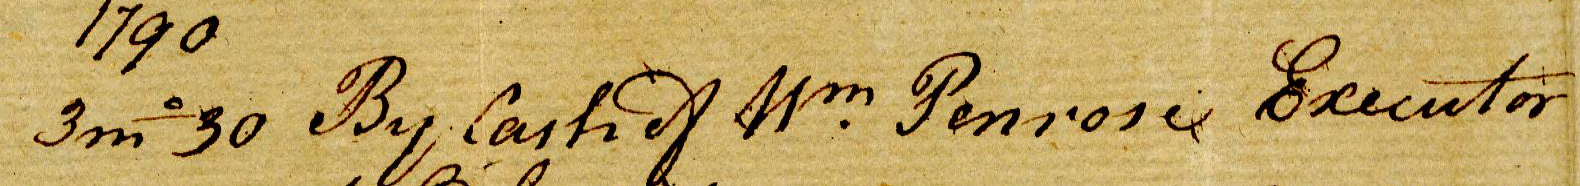3 m^o 30 By Cash of W^m. Penrose Executor
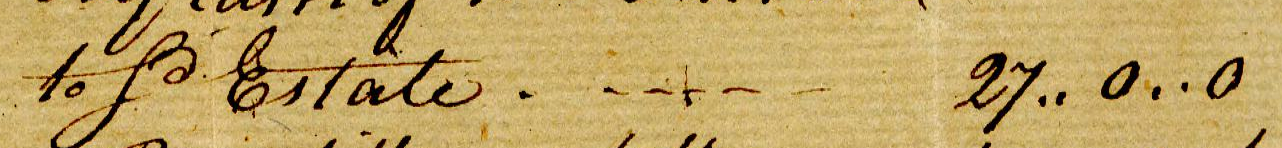to s^d Estate. ----- 27..0..0
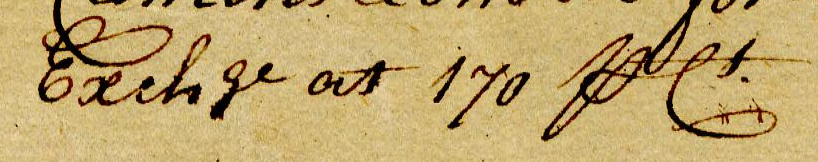Exchge at 170 per C^t.
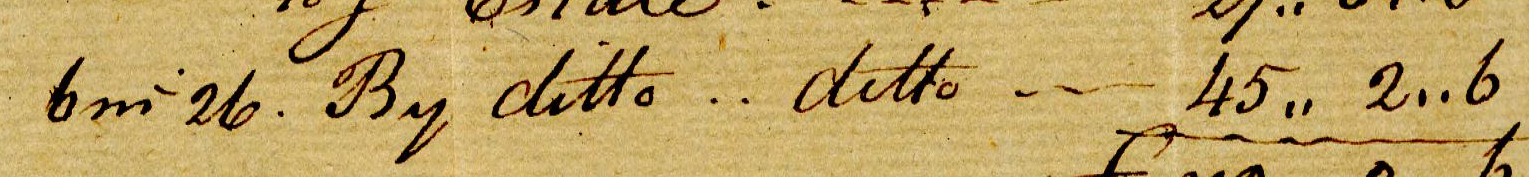6m 26 By ditto. . ditto -- 45.. 2..6
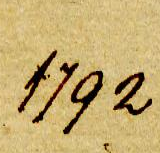1792
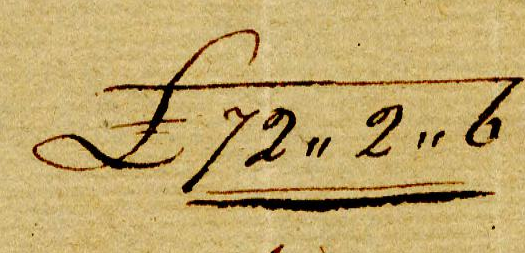£72..2..6
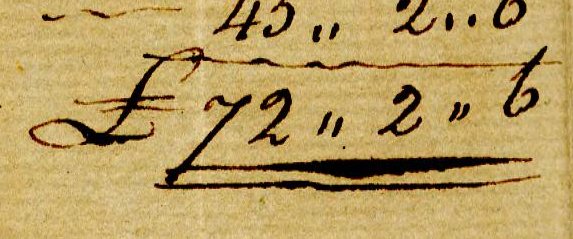£72..2..6
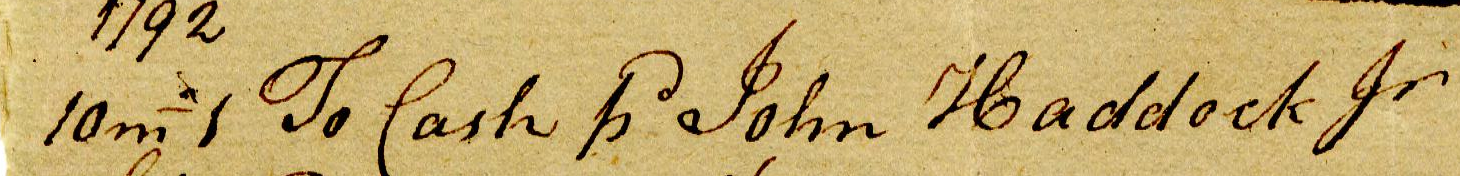10m^os To Cash p^d John Haddock J^r
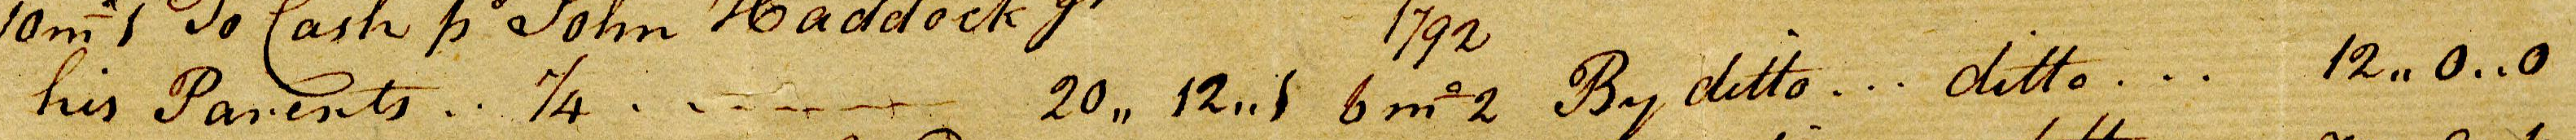his Parents.. 74. ------ 20.. 12.. 5 6 m^o 2 By ditto... ditto... 12..0..0
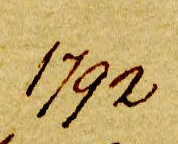1792
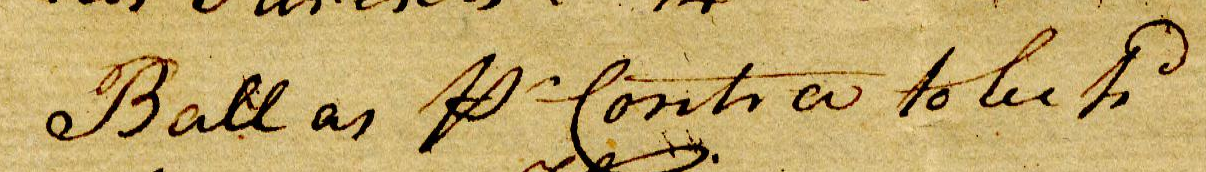Ball as per Contra to be p^d
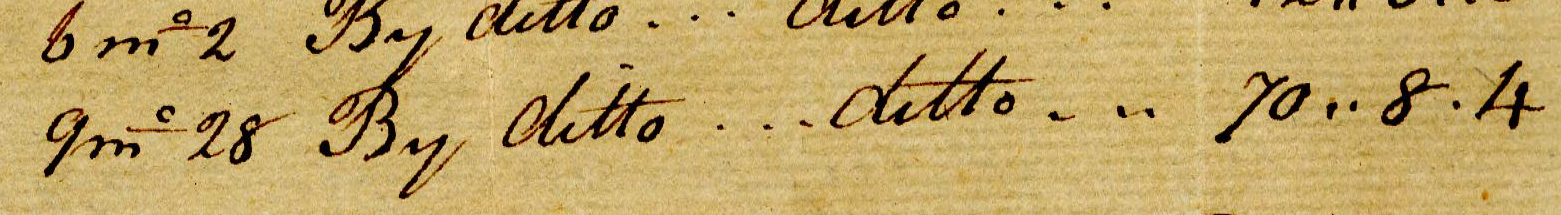9 m^o 28 By ditto... ditto... 70.. 8. 4
